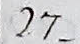27
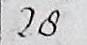28
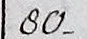80
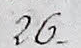26
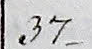37
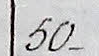50
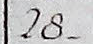28
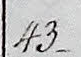43
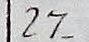27
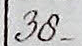38
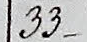33
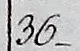36
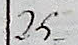25
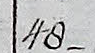48
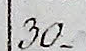30
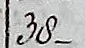38
